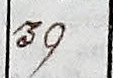39
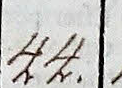44.
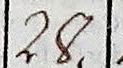28.
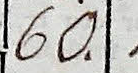60.
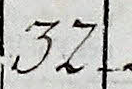32
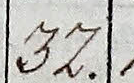32.
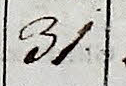31
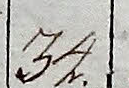34.
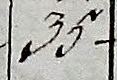35
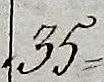35
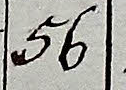56
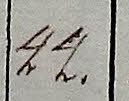44.
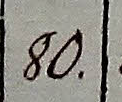80.
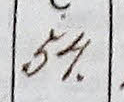54.
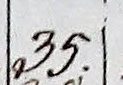35.
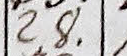28.
